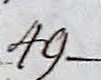49
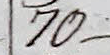70
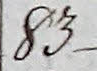83
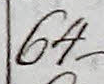64
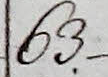63
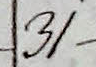31
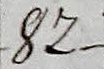82
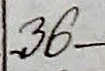36
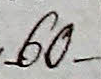60
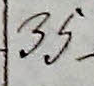35
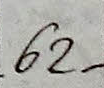62
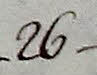26
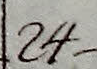24
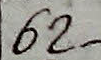62
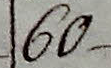60
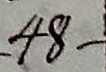48
